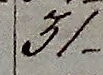31
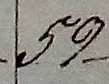59
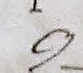9
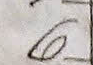6
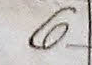6
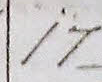17
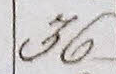36
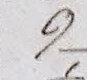9
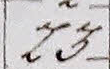23
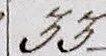33
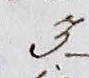3
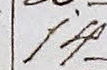14
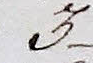3
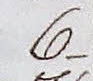6
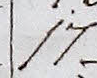17
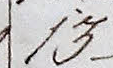13
